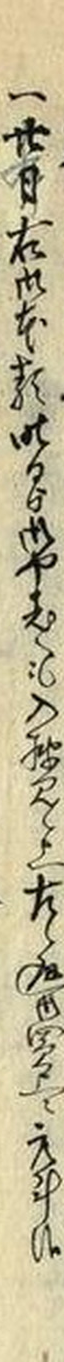一廿日右御本類昨日ゟ御中老へも入披見候上左之通御買上ニ取斗候
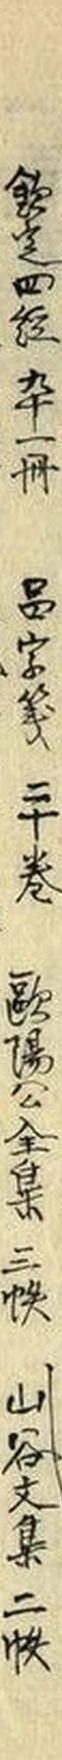欽定四経卆一冊品字箋二十巻歐陽公全集三帙山谷文集二帙
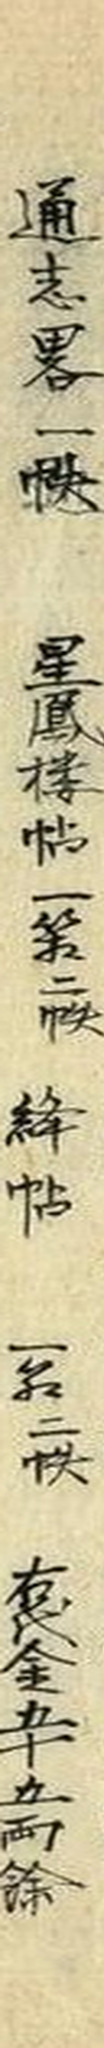通志畧一帙星鳳楼帖一箱二帙絳帖一箱二帙右代金五十五両餘
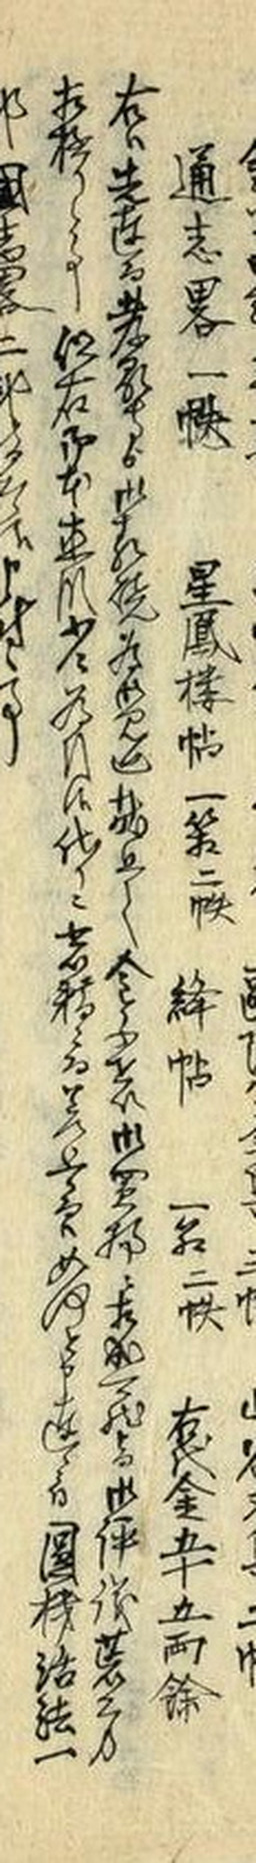右ハ先達而孝顕寺ゟ御類焼為御見廻献上之金子を以御買揚ニ相成可然旨御評議荒方
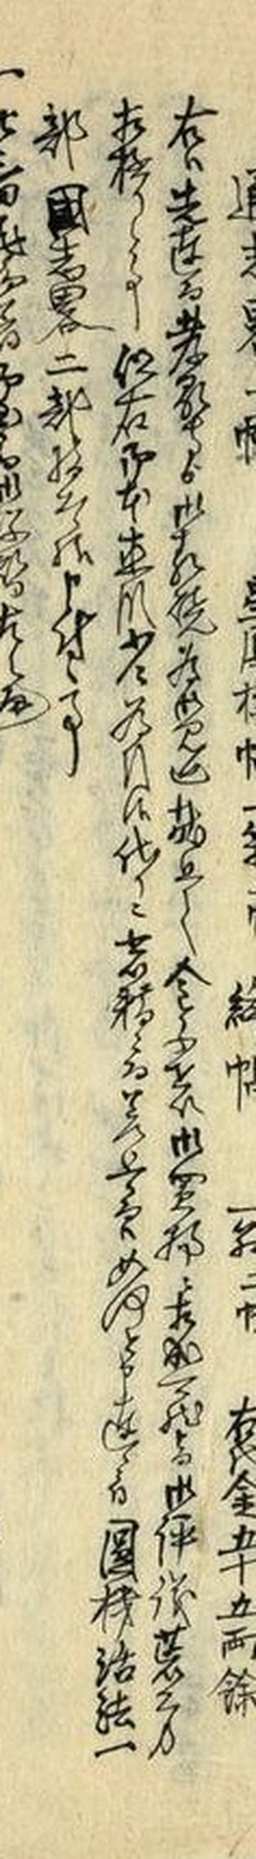相極り候事但右御本直段少々為引候代りニ書籍ニ而差上候而ハ如何と申達候ニ付圖械活法一
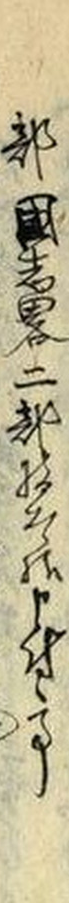部国志畧二部指出候様申付候事
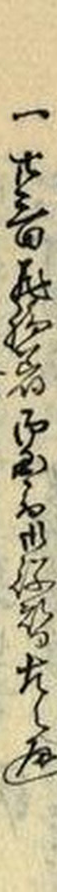一廿三日飛脚着御国ニ而御役替左之通
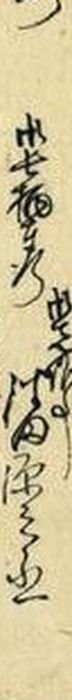御長柄奉行御先作事津田源之丞
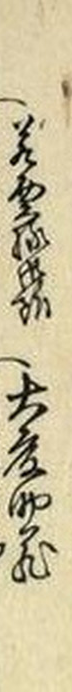若殿様御附大藤助蔵

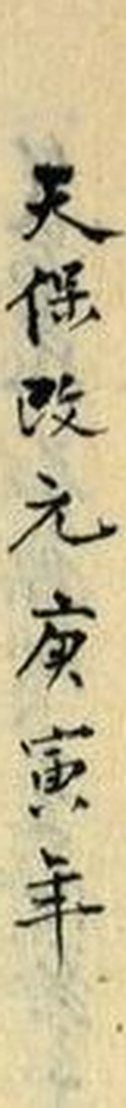天保改元庚寅年
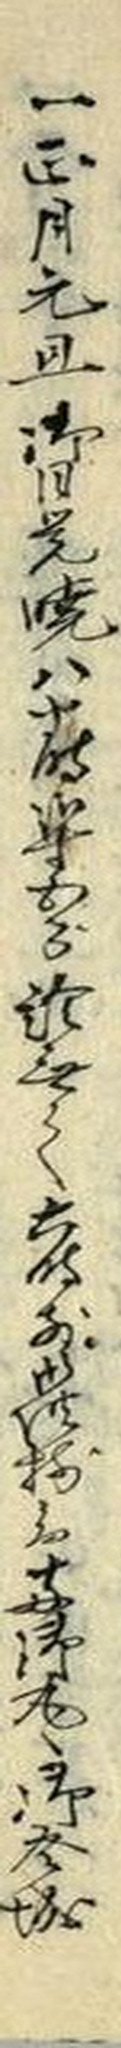一正月元旦御目覚暁八半時弐寸五分診無之六時前御供揃ニ而両御丸へ御登城
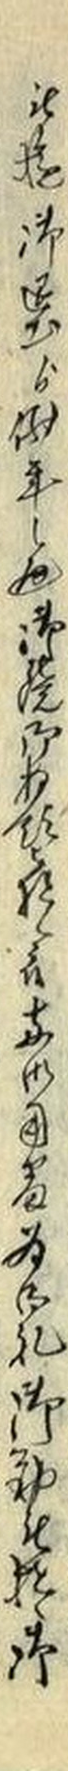被御遊退出ゟ例年之通御鏡御拝領被遊候ニ付両御用番為御礼御勤被遊候御
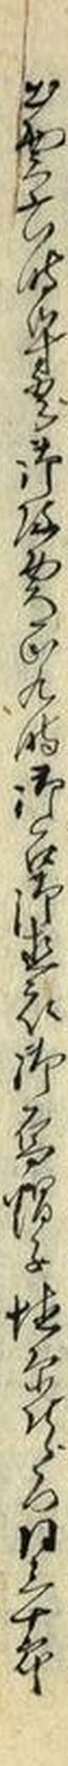出殿六時弐寸五分御帰殿正九時御召御直衣御烏帽子埴原次郎右衛門同三十郎
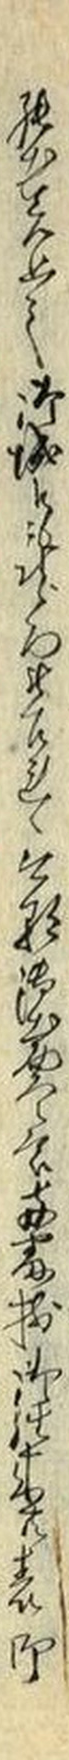罷出差上之御城江も次郎右衛門被召連候今朝御出殿之節両番揃御往来共表御
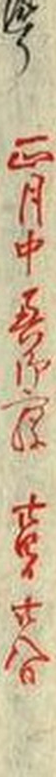正月中奥御寝廿四日廿八日
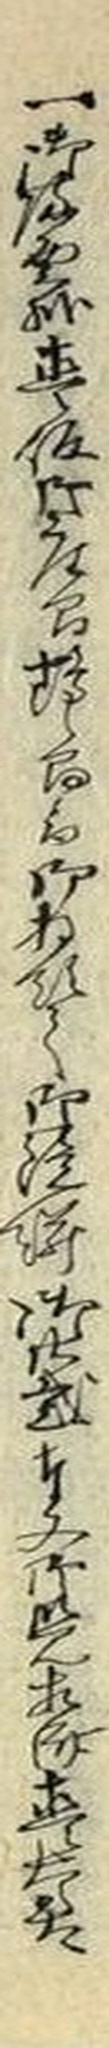一御帰殿掛直々仮御座之間鶴之間ニ而御拝領之御鏡餅御頂戴奉文御覧相済直々大奥
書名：少傅日録抄（斉承付側向頭取日記、在府）
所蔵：福井県文書館 Fukui Prefectural Archives
